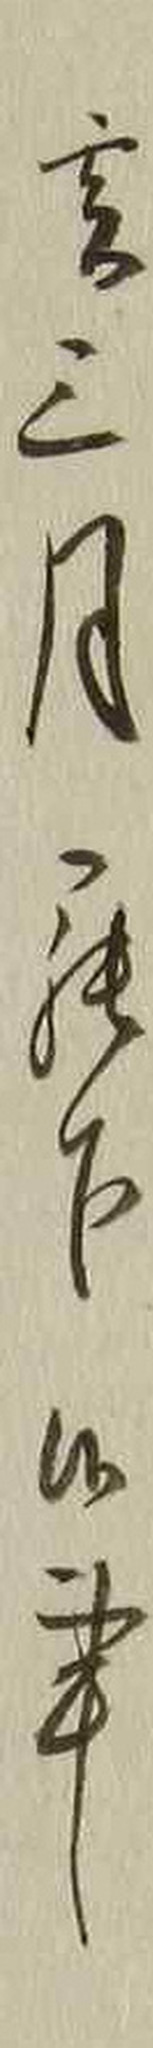亥三月罷下候事
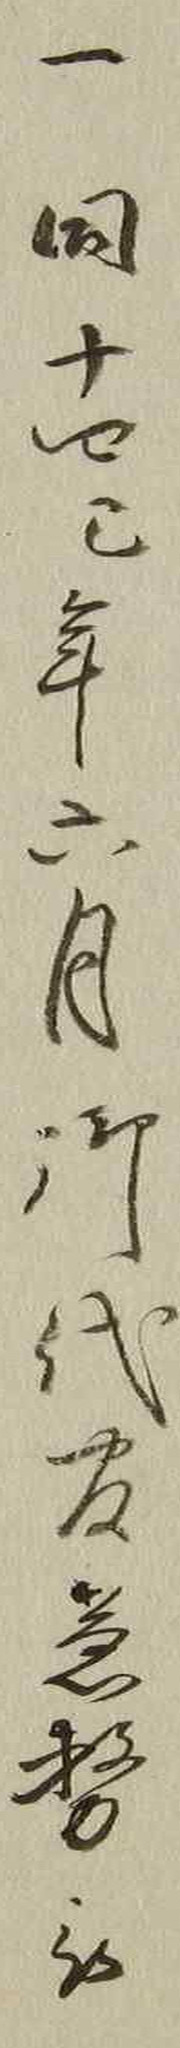一同十四巳年六月御代官兼務被
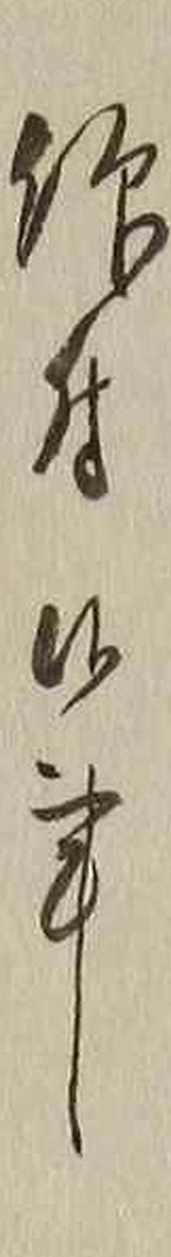仰付候事
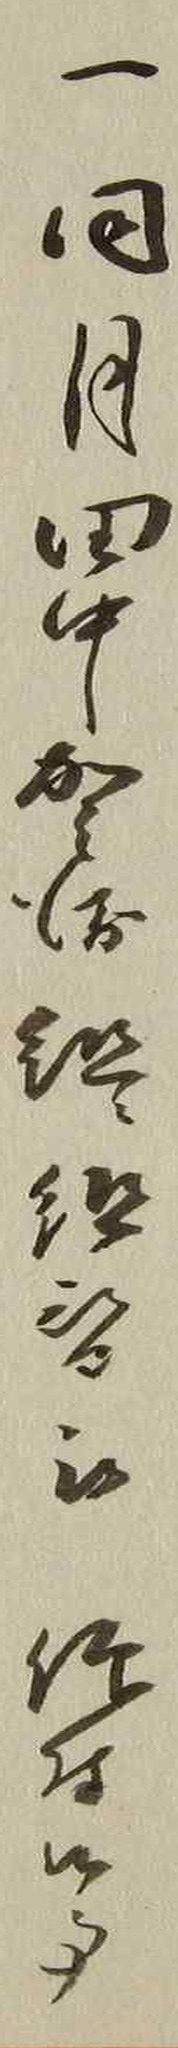一同月田中加兵衛組ニ組替被仰付候事
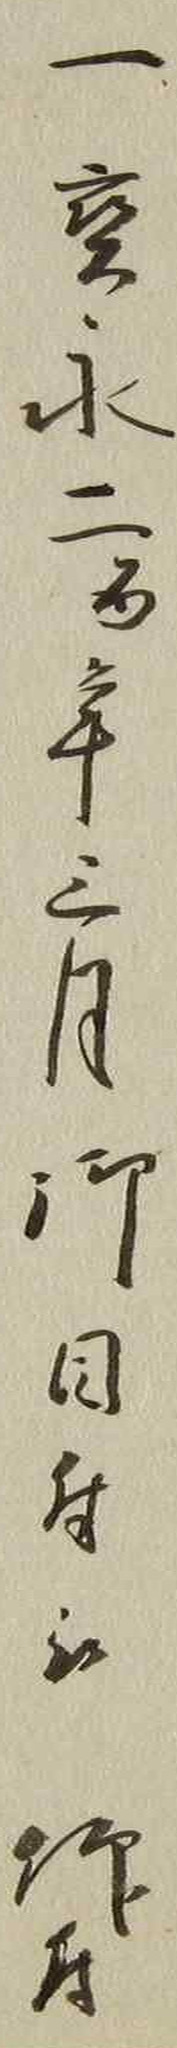一宝水二酉年三月御目付被仰付
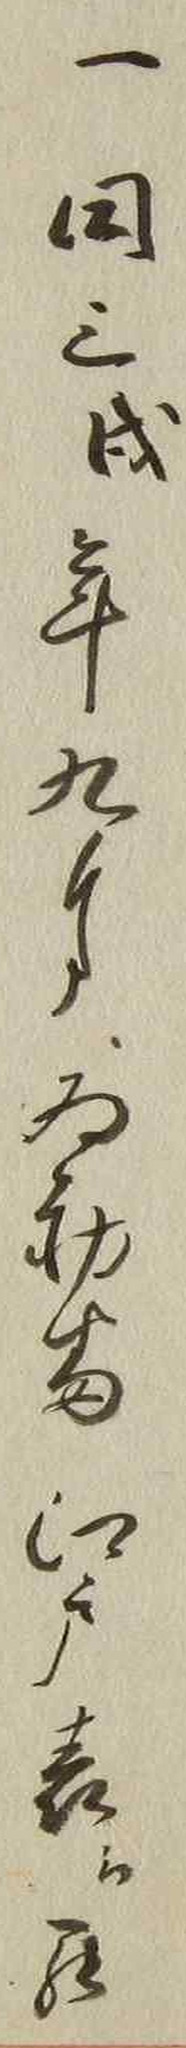一同三戌年九月為勤番江戸表江罷
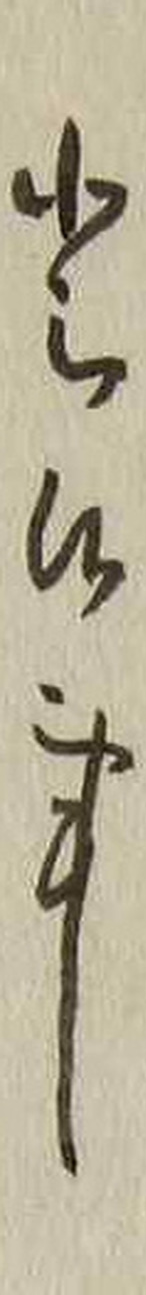登候事
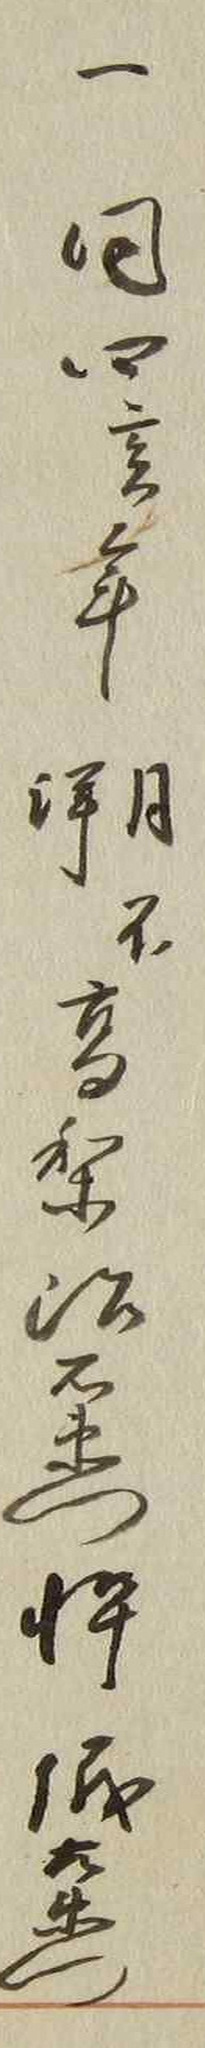一同四亥年月不詳高梨治右衛門忰儀左集門
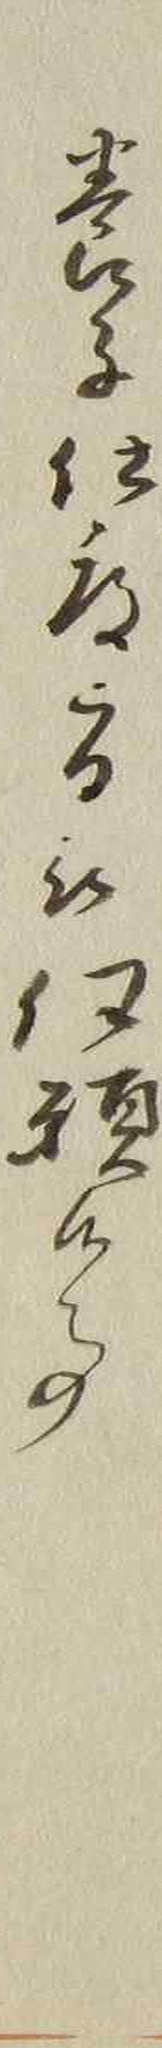養子仕度旨被任願候事
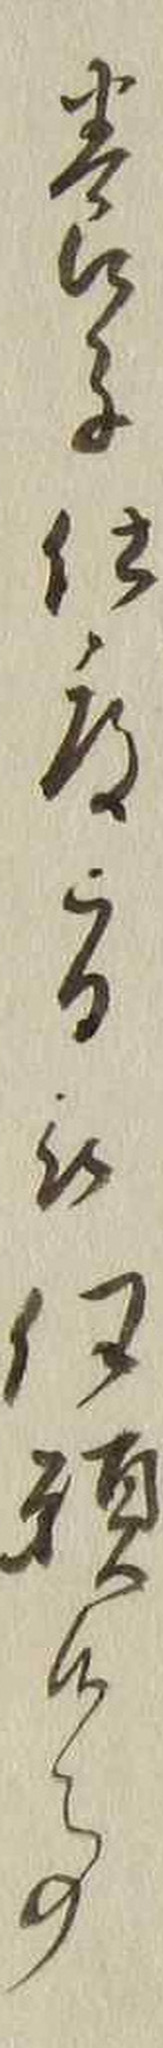養子仕度旨被任願候事
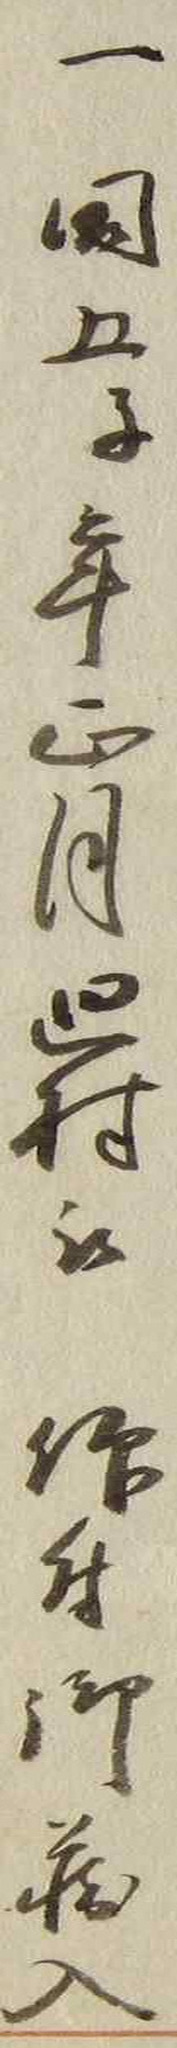一同五子年正月廻村被仰付御蔵入
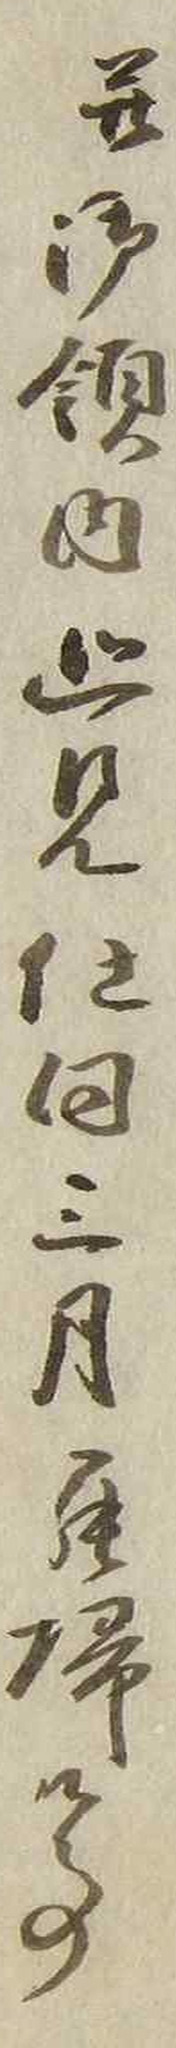并御領内廻見仕同三月罷帰候事
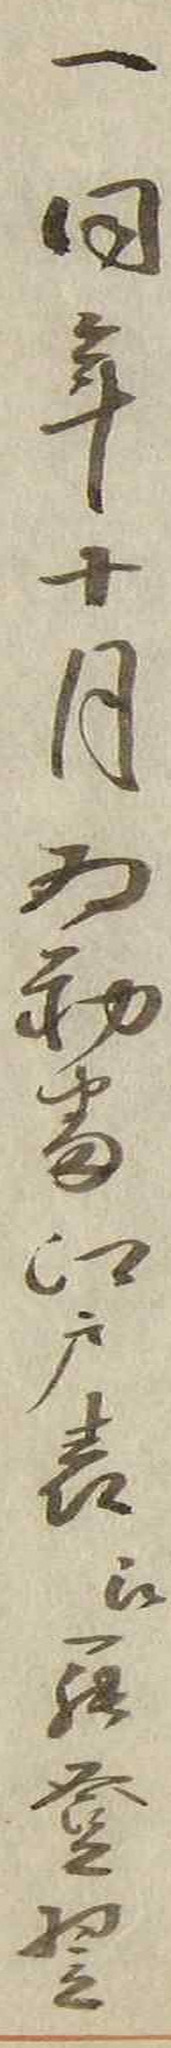一同年十月為勤番江戸表江罷登翌

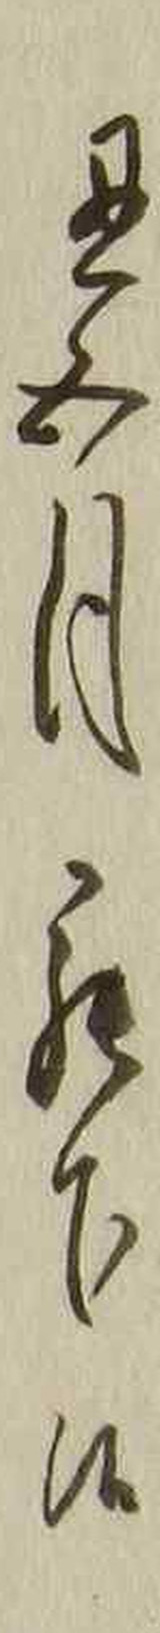丑五月罷下候
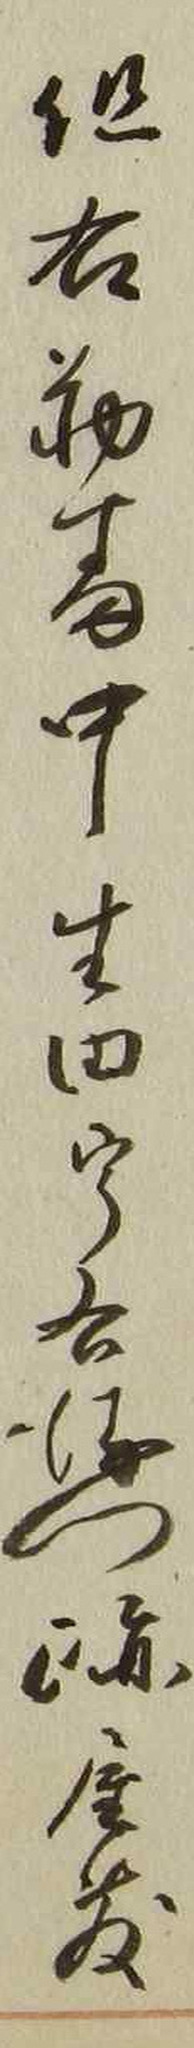但右勤番中生田宇右衛門跡屋敷
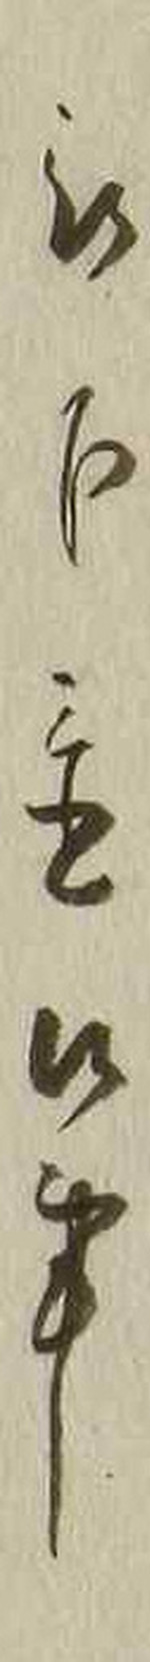被下置候事
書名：諸士系譜　巻之122　よ之部5
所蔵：会津若松市立会津図書館
